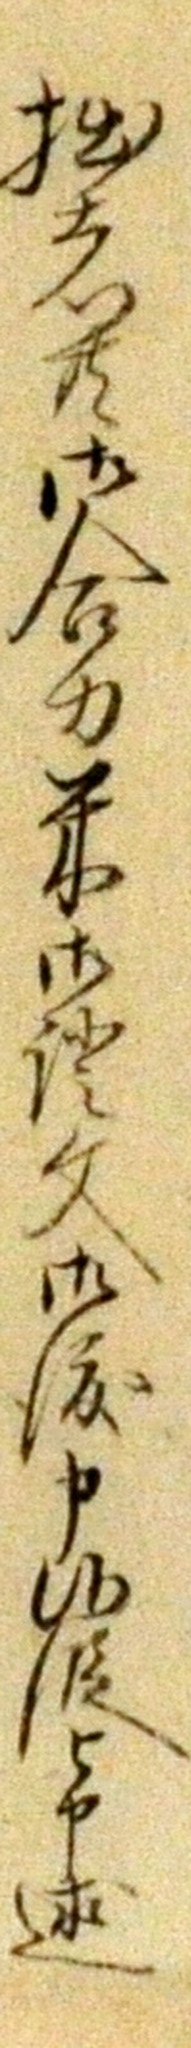拙者共御合力米御證文御渡申候段被申述
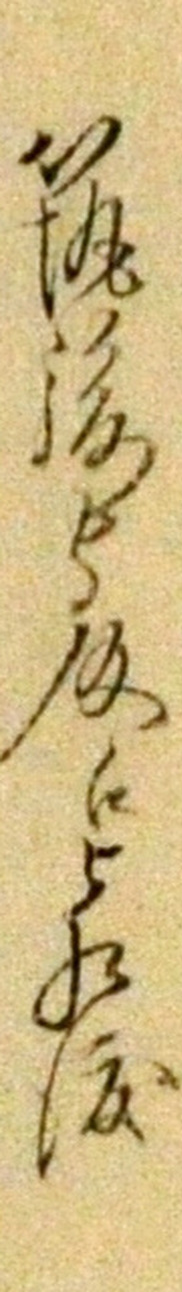筑後守殿え被相渡
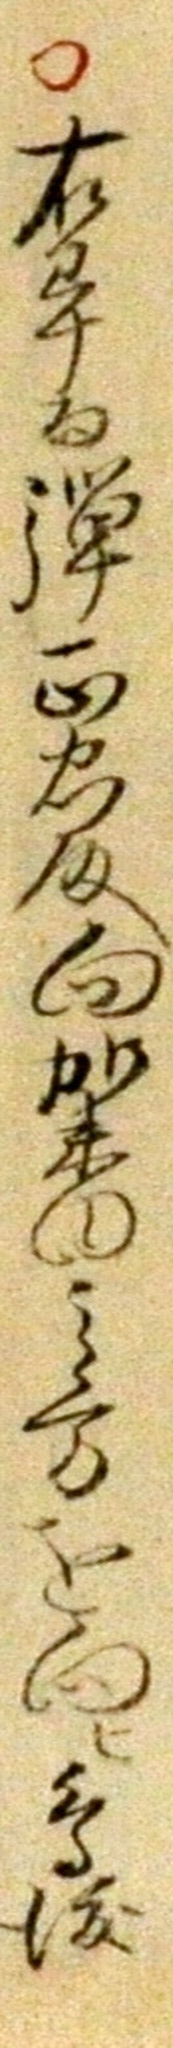右畢而弾正忠殿向加番之方を向ヒ鳥渡
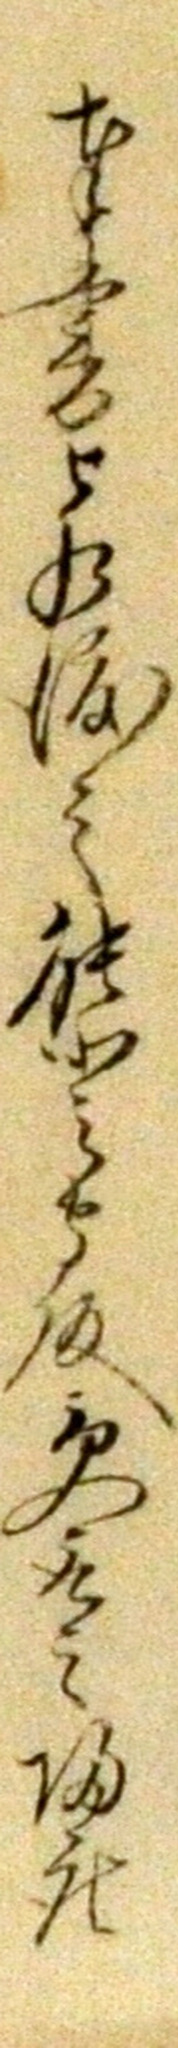奉書被相渡之能登守殿受取之帰座
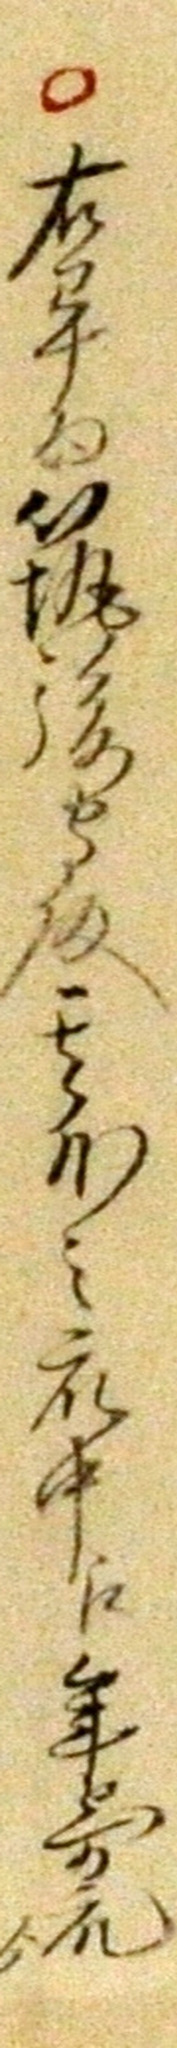右畢而筑後守殿其外之衆中え年寄衆ゟ
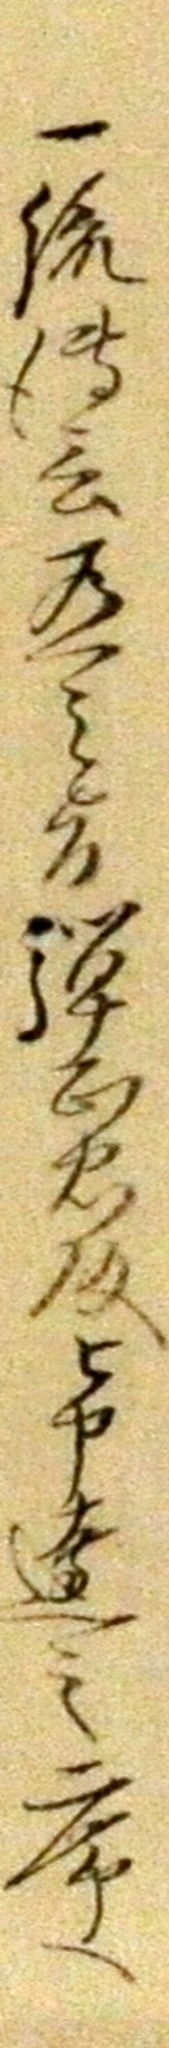一統伝言有之旨弾正忠殿被申達之席へ
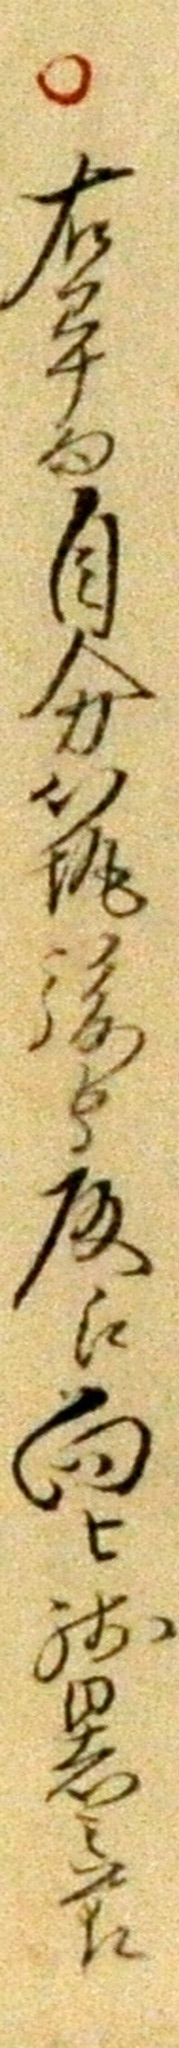右畢而自分筑後守殿え向ヒ残暑之節
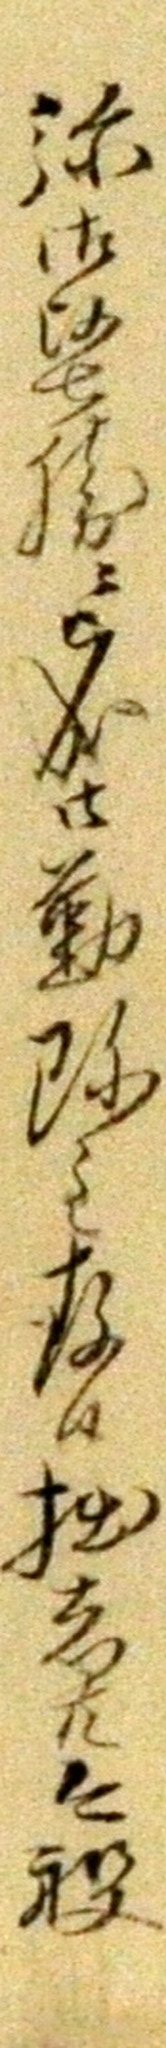弥御堅勝ニ被成御勤珍重存候拙者共今般
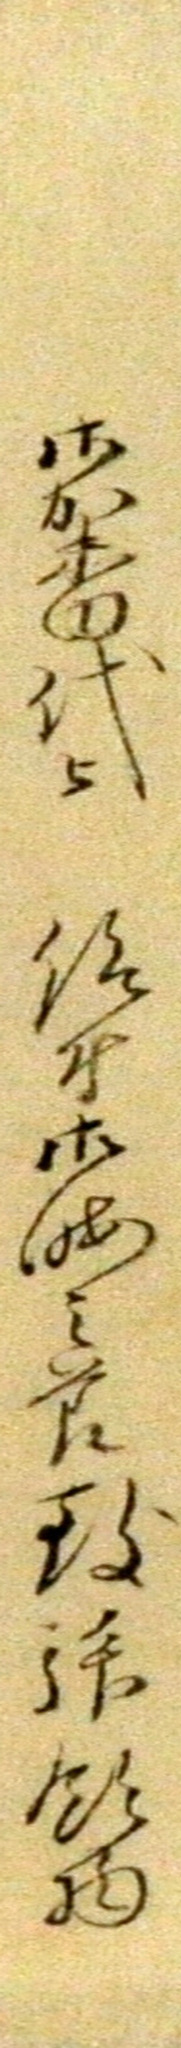御加番代被仰付御晦之節致拝領物
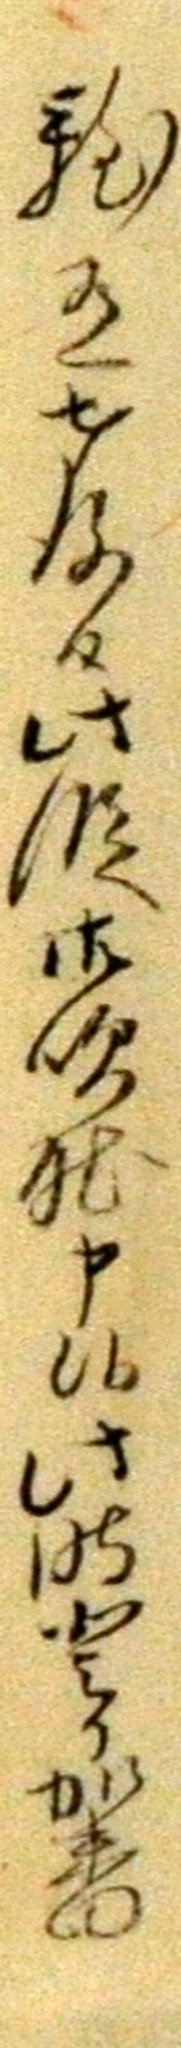難有奉存候此段御吹聴申候此時登り加番

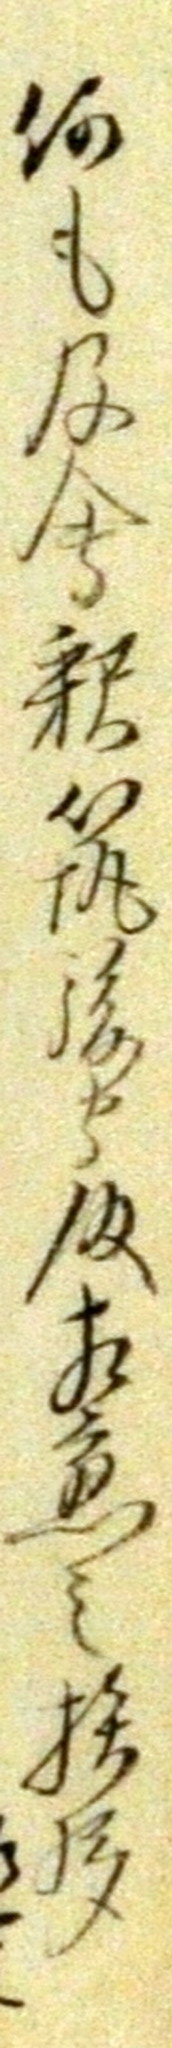何も及会釈筑後守殿相応之挨拶有之
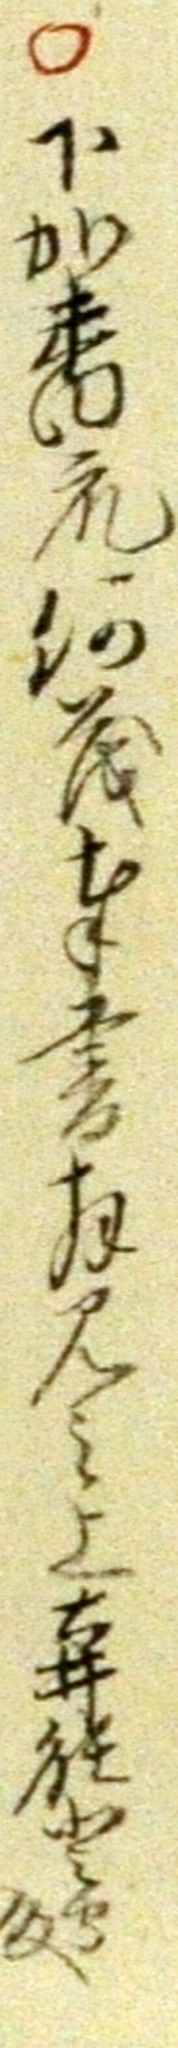下加番衆何も奉書拝見之上土井能登守殿
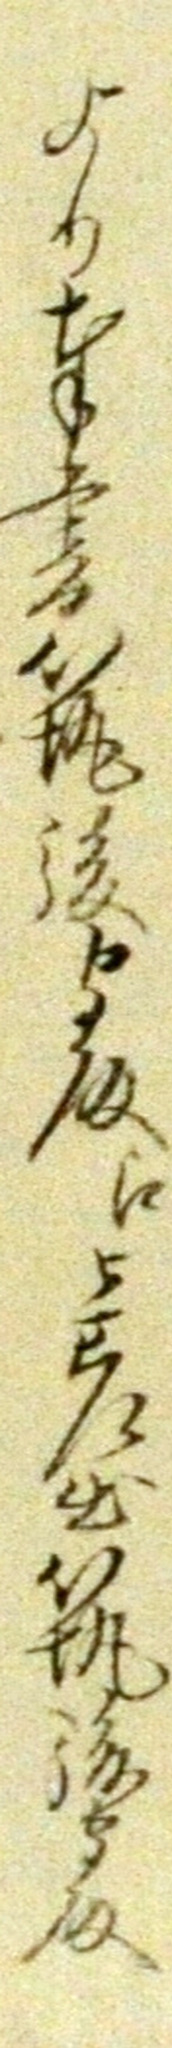より奉書筑後守殿え被差出筑後守殿
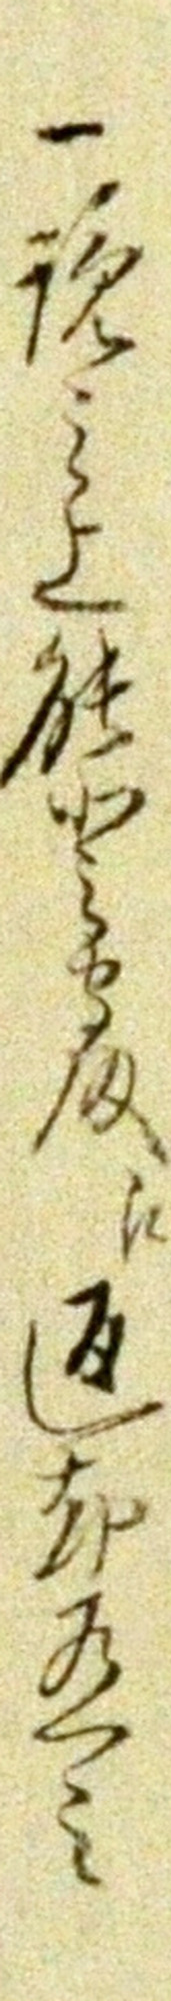一覧之能登守殿え返却有之
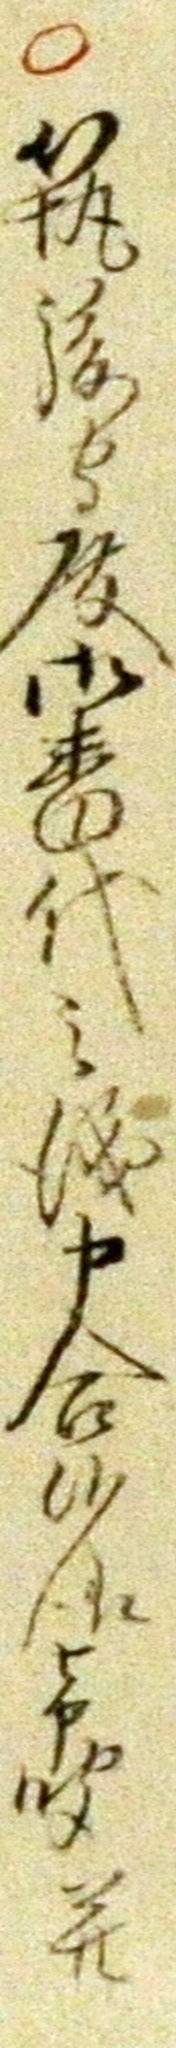筑後守殿御番代之儀申合候様被申聞并
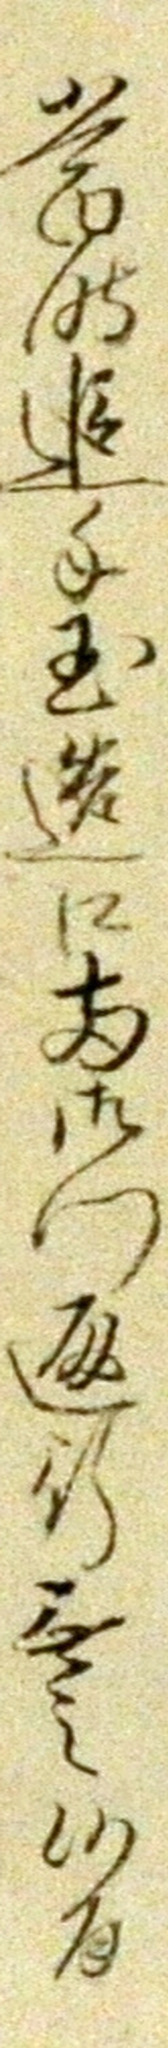当時追手玉造口両御門通行無之候間
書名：大阪加番関係諸書留〔一括〕
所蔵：伊那市立高遠町図書館・合同会社AMANE
